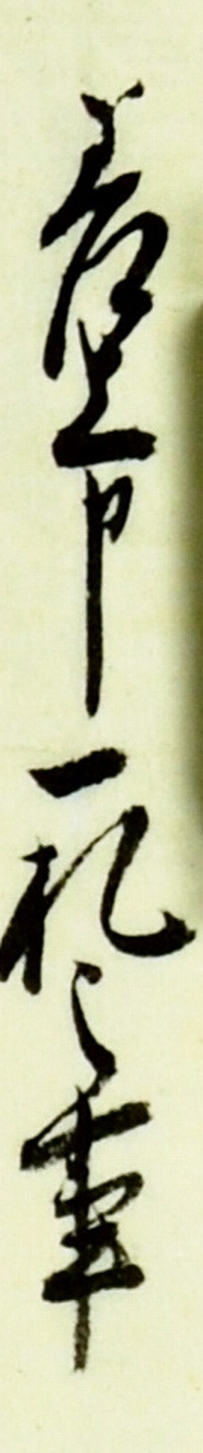差上申一札之事
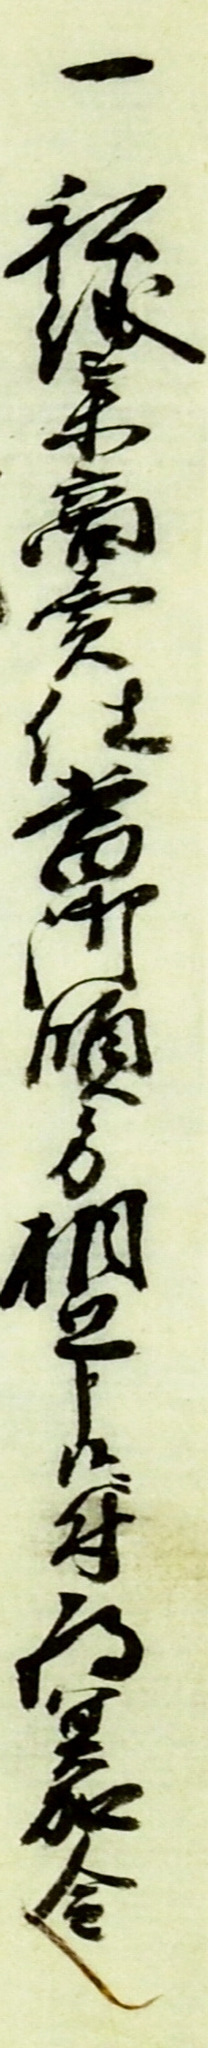一私儀薬商売仕当御領分相廻申候ニ付為冥加金也
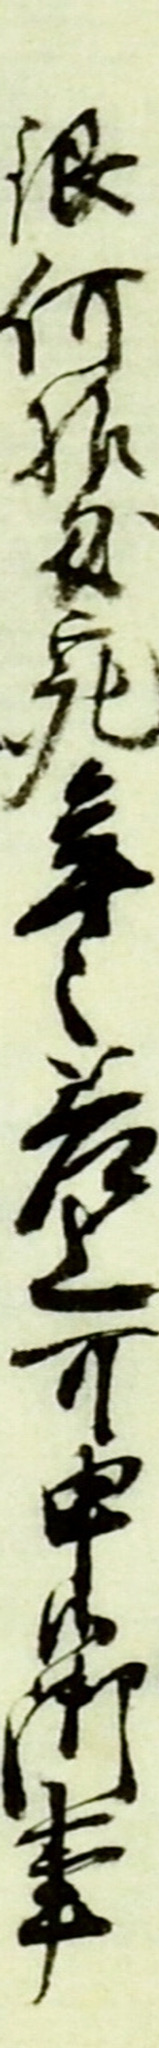銀何拾匁宛年々差上可申候御事
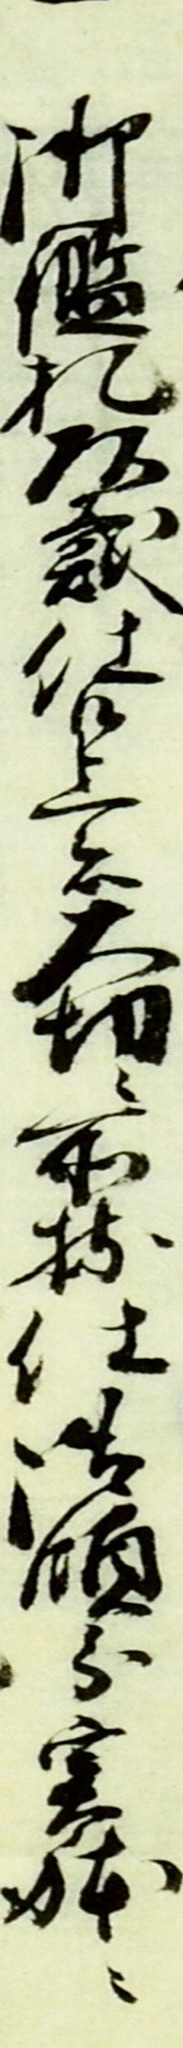一御鑑札頂戴仕候上者大切ニ所持仕御領分実丁躰ニ
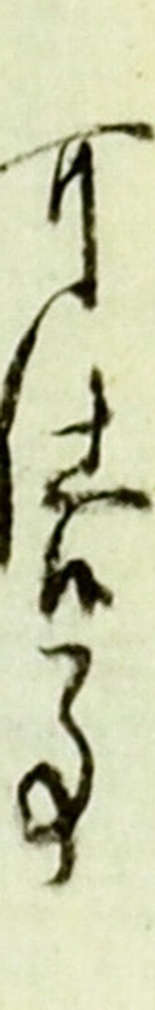可仕候事
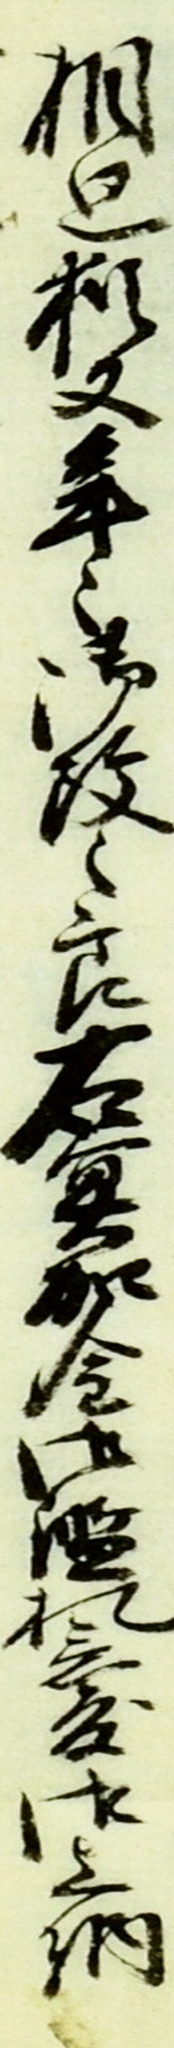相廻猶又年々御改之節右冥加金御鑑札急度御上納
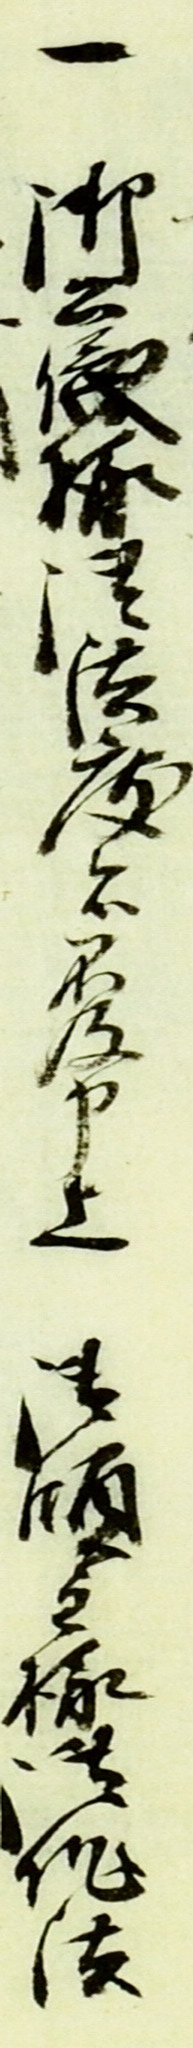一御公儀様御法度者不及申上御領主様御作法
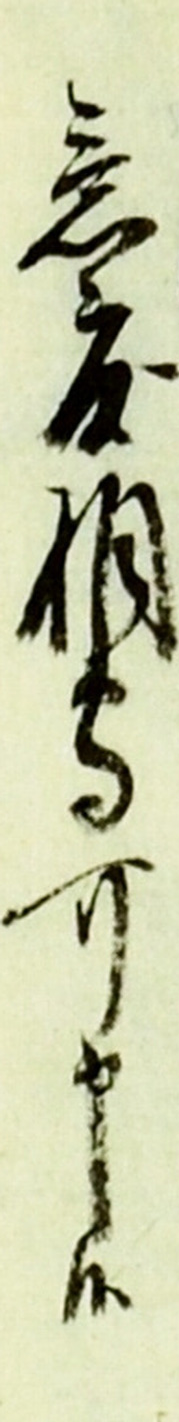急度相守可申候
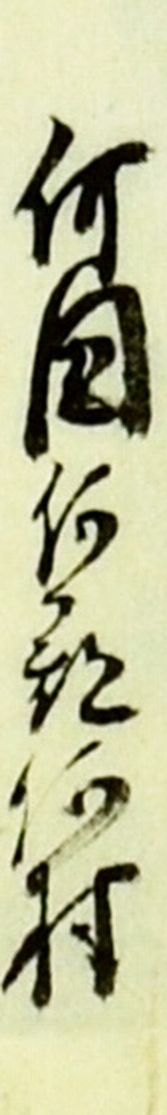何国何郡何村
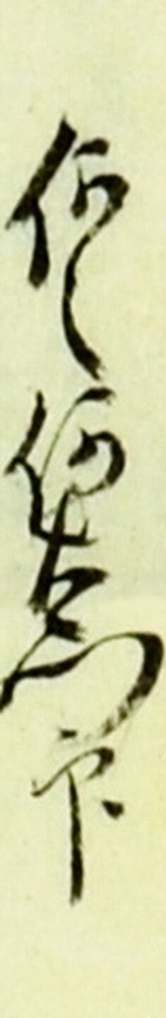何之何右衛門印
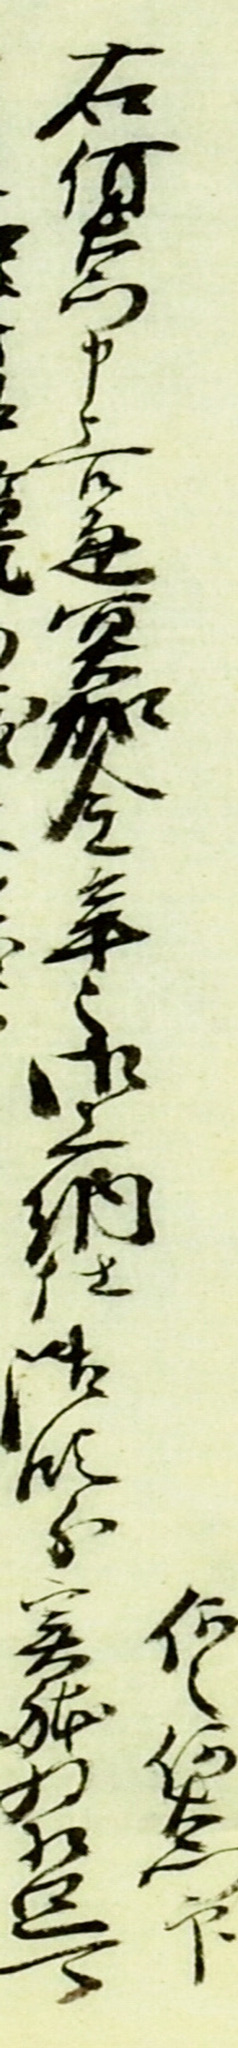右何右衛門申上候通冥加金年々御上納仕御領分実躰為相廻可
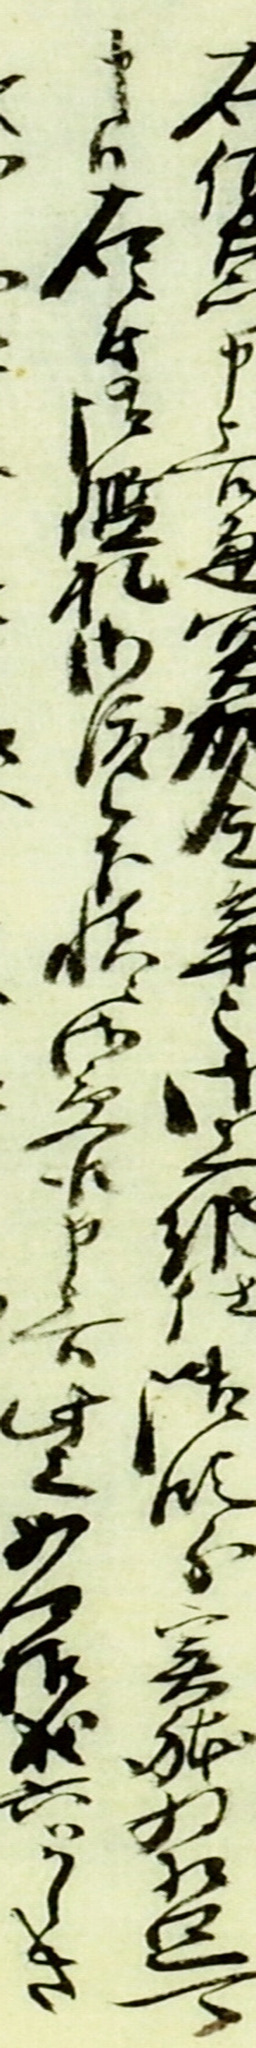申候右ニ付御鑑札御渡被下慎ニ御受取申上候此上如何様成六つかしき
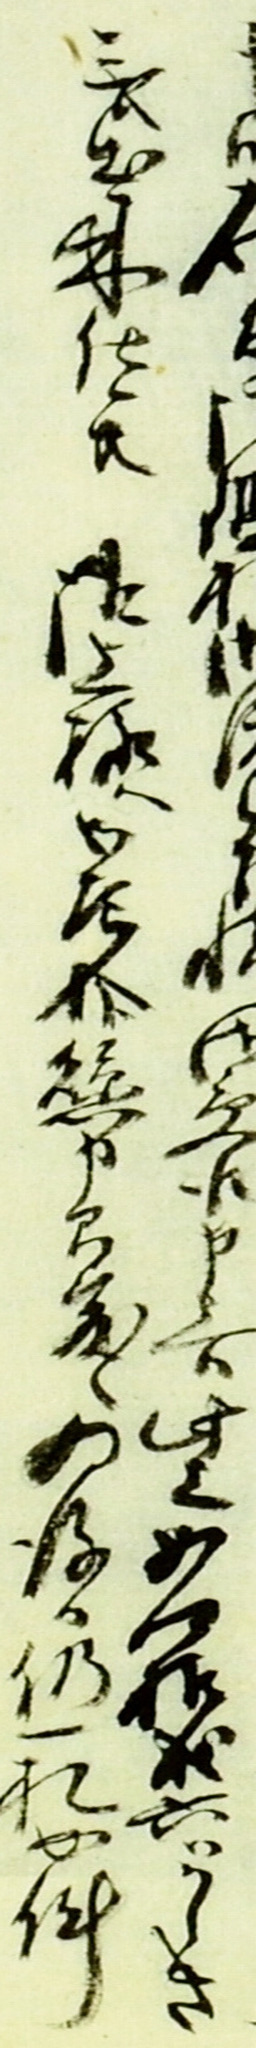義出来仕候共御上様へ御厄介態申間敷候為後日仍一札如件
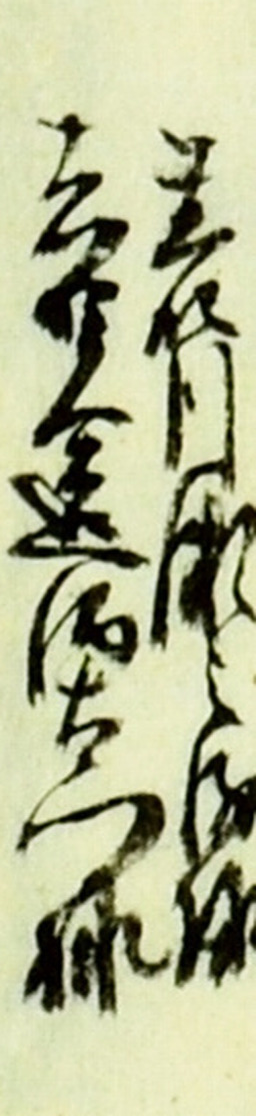志賀造酒右衛門様
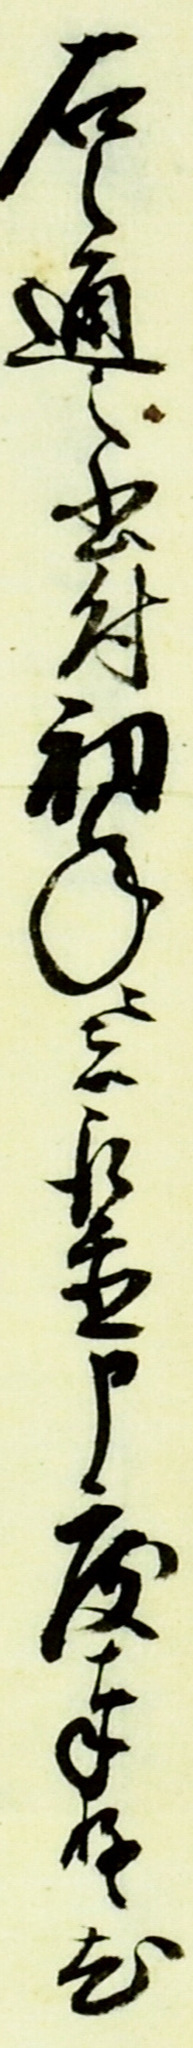右之通之書付初年ニ者取置申度奉存候尤
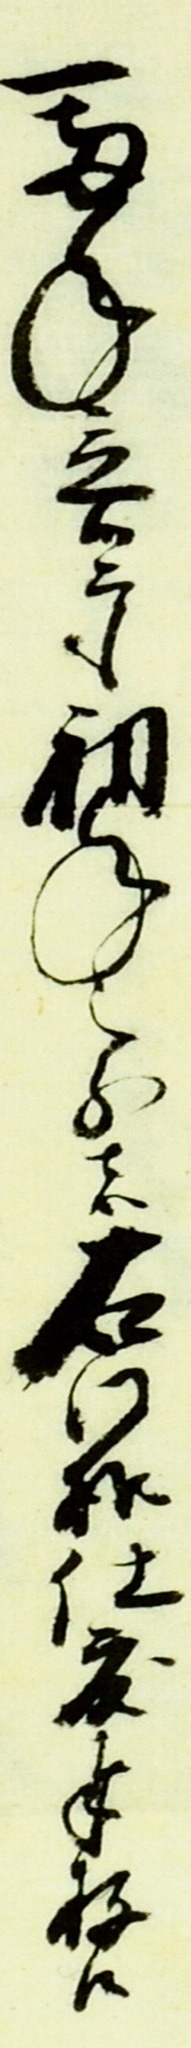一両年立候ニも初年之分者右同様仕度奉存候
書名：他国賣薬師運上之事
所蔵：伊那市立高遠町図書館・合同会社AMANE
